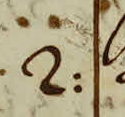2:
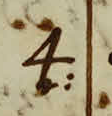4:
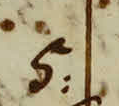5:
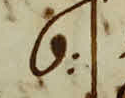6:
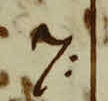7:
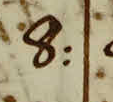8:
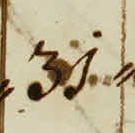31
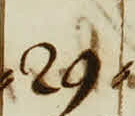29
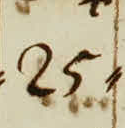25
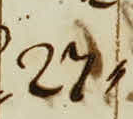27
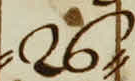26
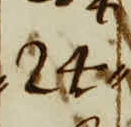24
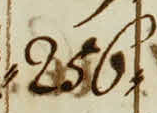256
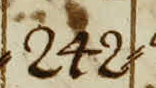242
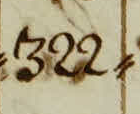322
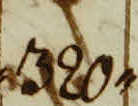320
